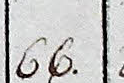66.
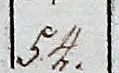54.
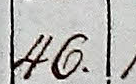46.
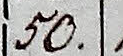50.
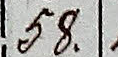58.
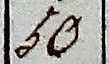50
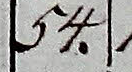54.
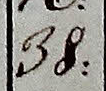38
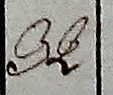32
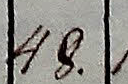48.
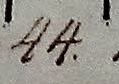44.
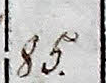85.
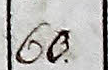60.
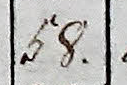58.
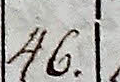46.
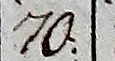70.
